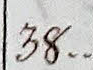38
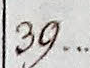39
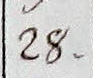28
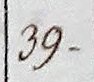39
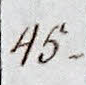45
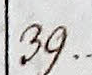39
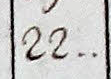22.
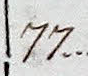77
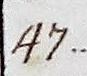47
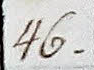46
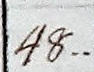48
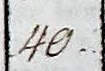40
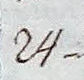24
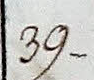39
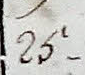25
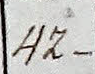42
